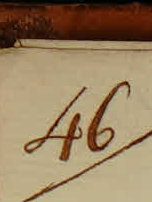46
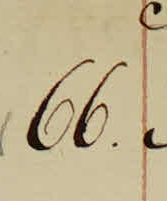66.
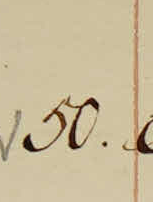50.
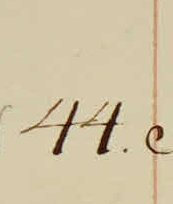44.
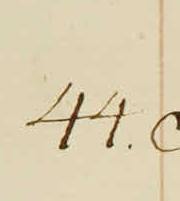44.
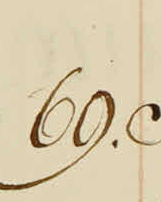69.
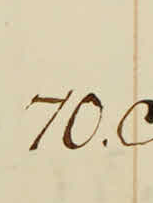70.
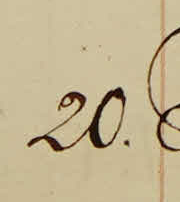20.
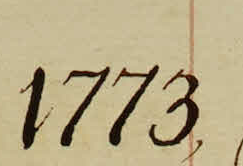1773,
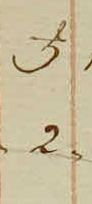2
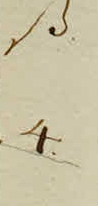4.
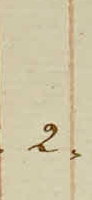2
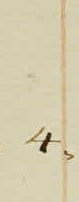4
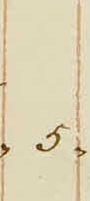5
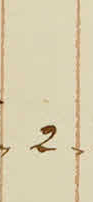2
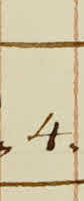4
